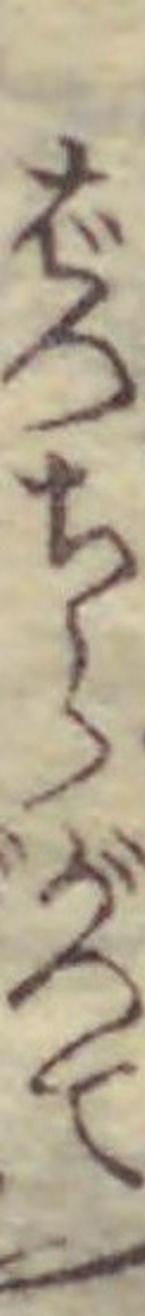ばつちらがつて
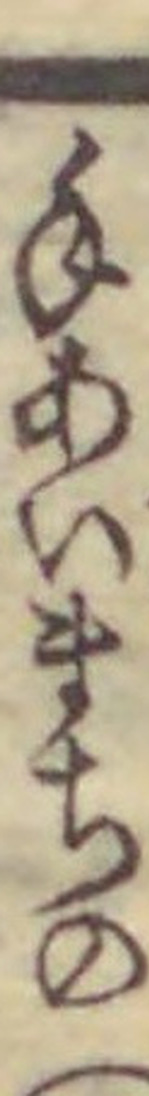手あいまちの
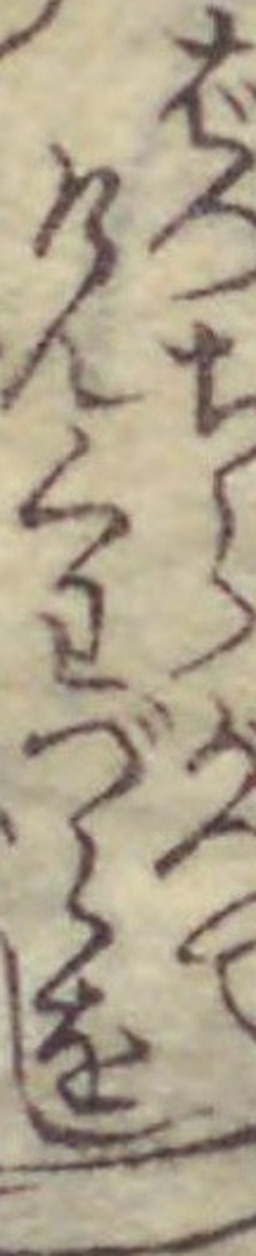けんくわづらをし
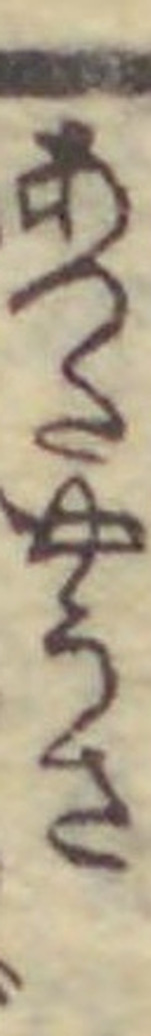あつたやうさ
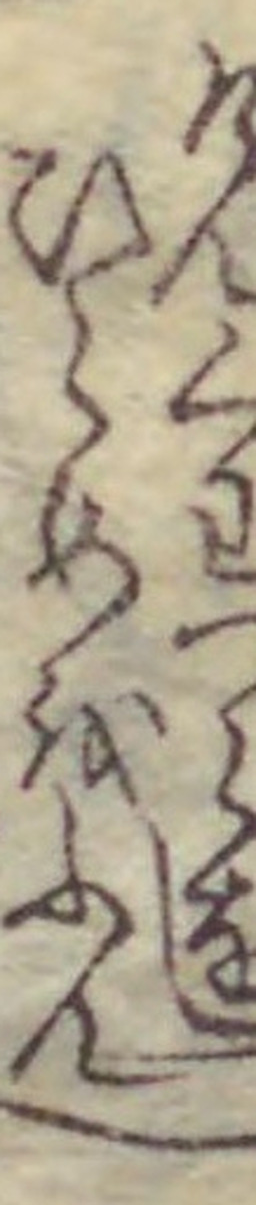ひらめをふん
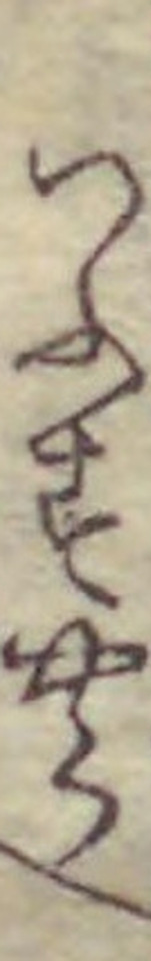つふすやう
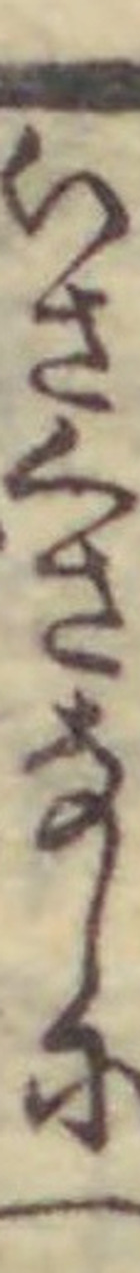いさくさなしに
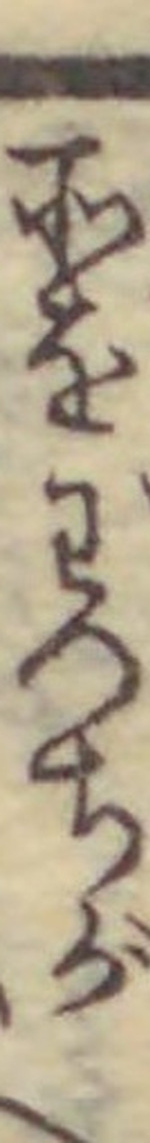所をわつちが
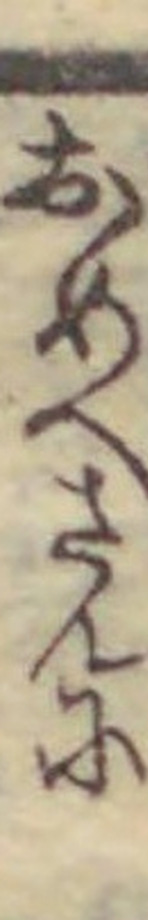おめへさんに
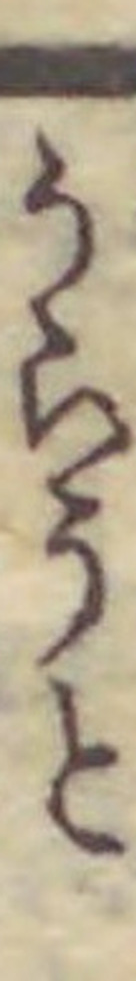うらうと
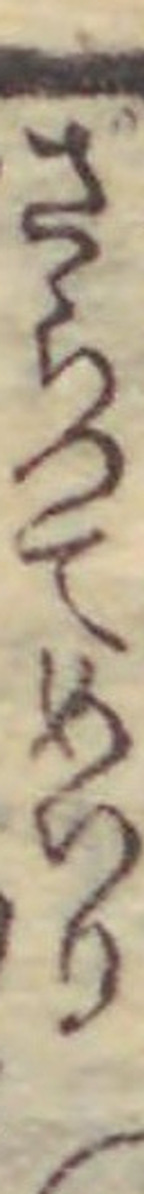さらつてめいり
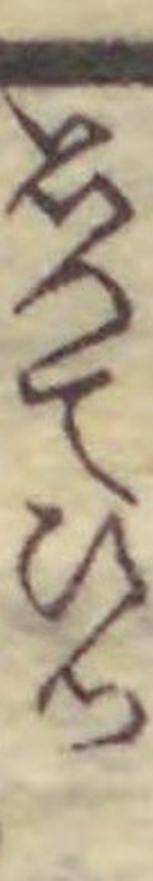思つてひつ
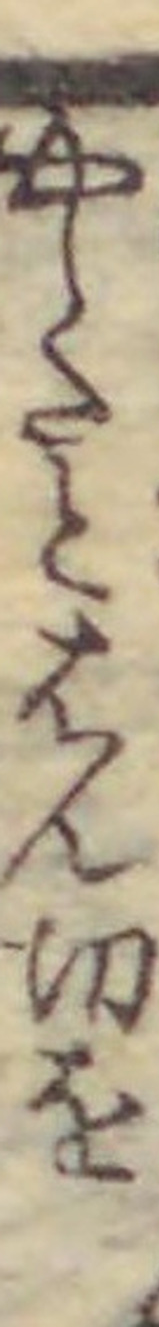やしたとはん切を
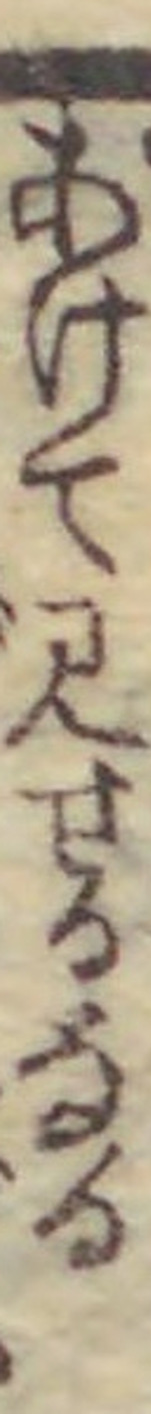あけて見せるなる
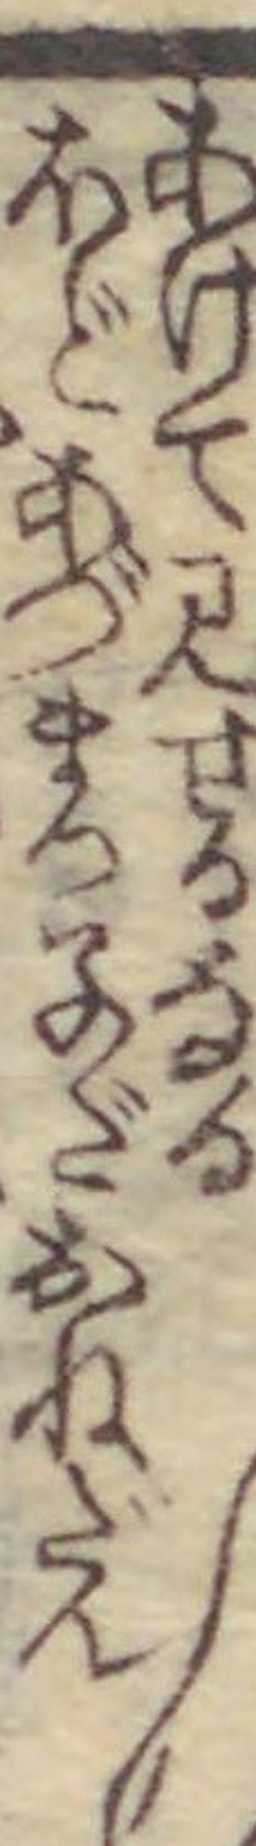ほどあづまつ子だおねだん
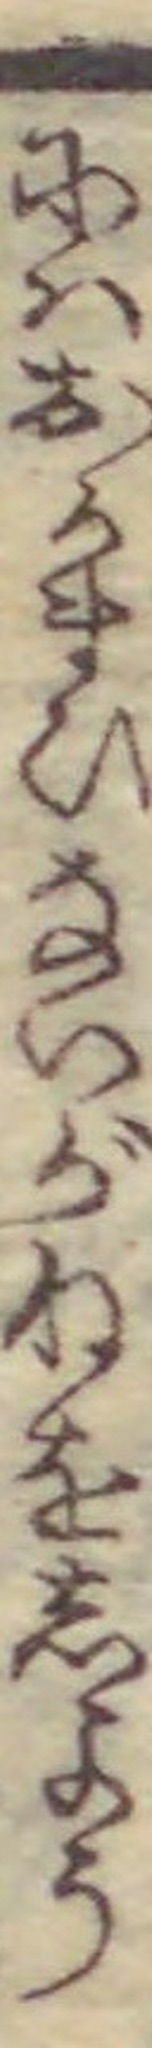にはおかまひないがねをしよう
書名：大時代唐土化物 3巻. 曽我太夫染
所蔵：国立国会図書館 National Diet Library, JAPAN
